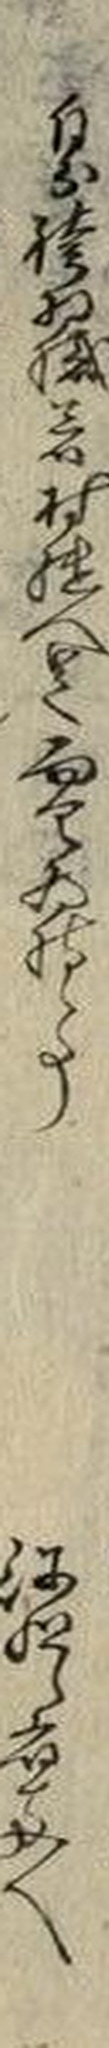自分袴羽織着村継人足雨具為持候事役組之者両人
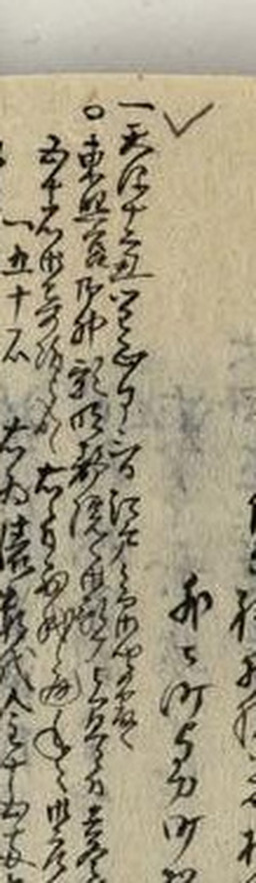一天明十二丑閏正月三日江戸ニ而御聞番へ
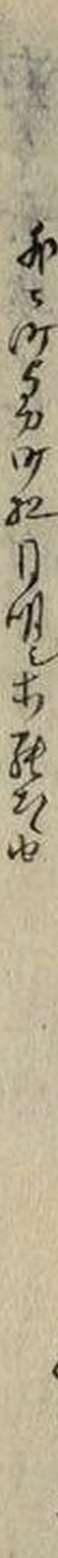外ニ町与力町組目明シ等罷出候由
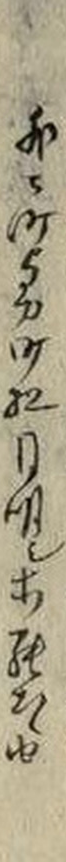外ニ町与力町組目明シ等罷出候由
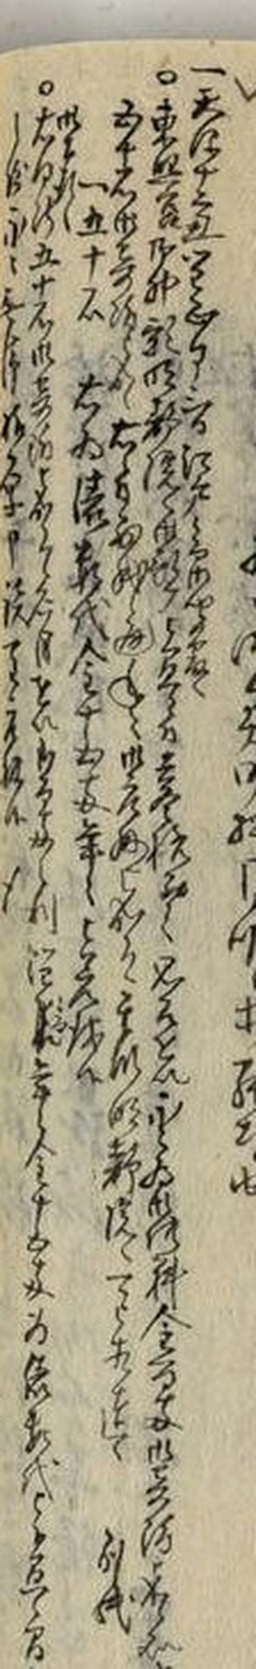五十石御寄附被成候右ニ付別紙之通年々御取扱被成下候其段明静院へ可被相達候別紙
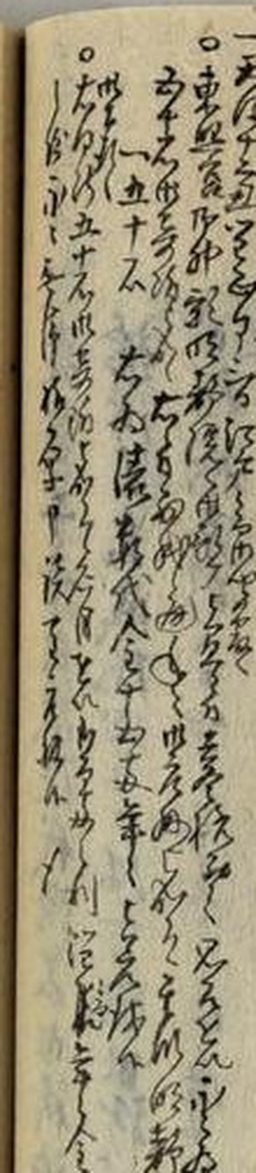一五十石右為俵数代金十五両年々被差越候
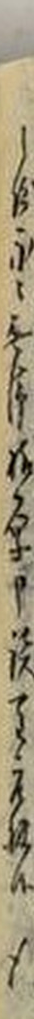之儀永々無滞様厚申談可被取扱候〆
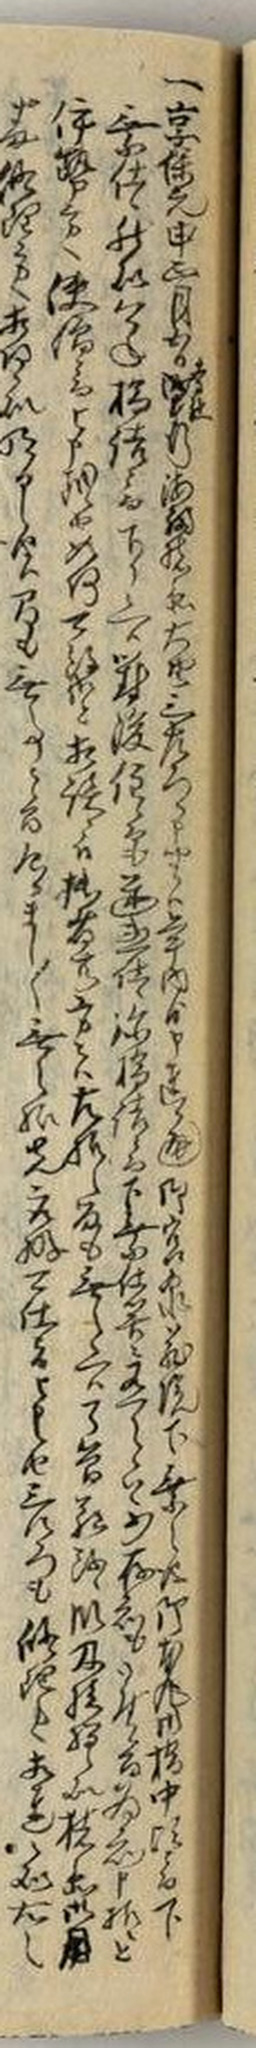乗仕候然処今年橋詰ニ而下り候へハ対後住候而も迷惑仕候弥橋詰ニ而下乗仕筈ニ有之候ハヽ少存知も御座候間為知申様ニと
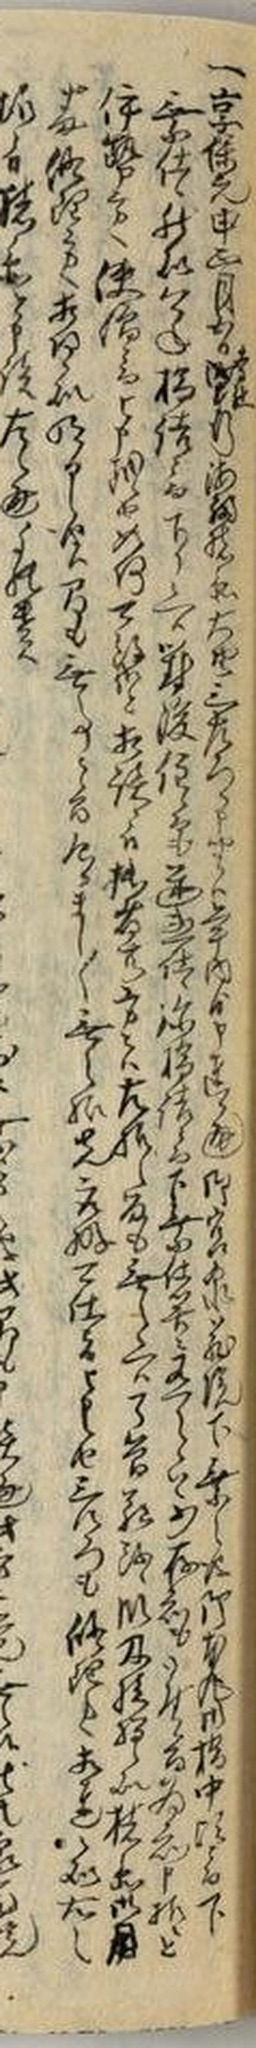伊勢方へ使僧ニ而被申越候由如何可致哉と相談ニ付拙者共方ニハ左様之留も無之候ヘハ了簡難致候段及挨拶候処御用
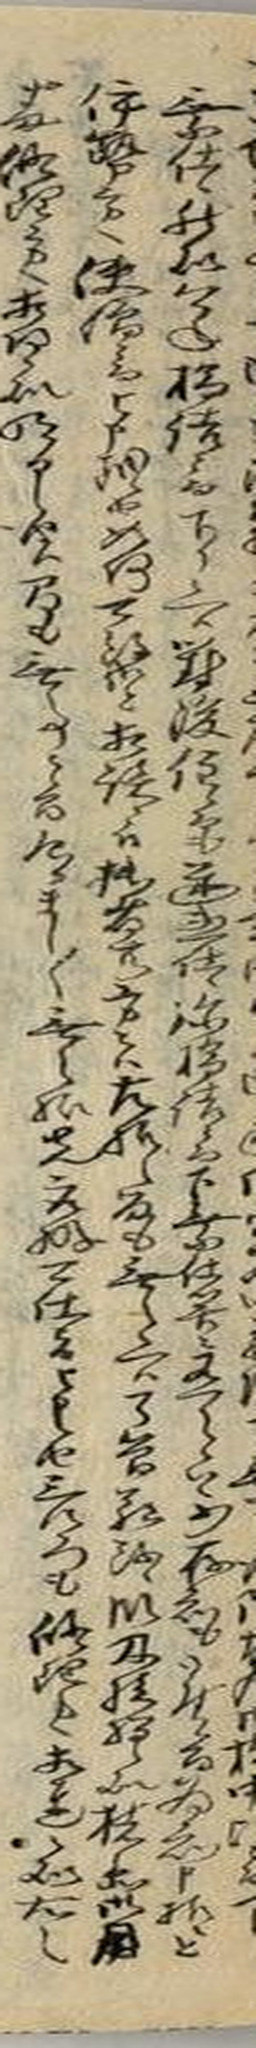番修理方へ相伺候処明日之儀ハ間も無事ニ候間やかましく無之様先取扱可仕旨被申候由三左衛門も修理方へ相達候処右之
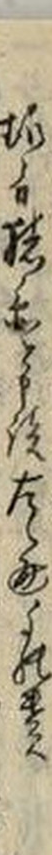趣ニ付猪兵衛と申談左之通手紙遣ス
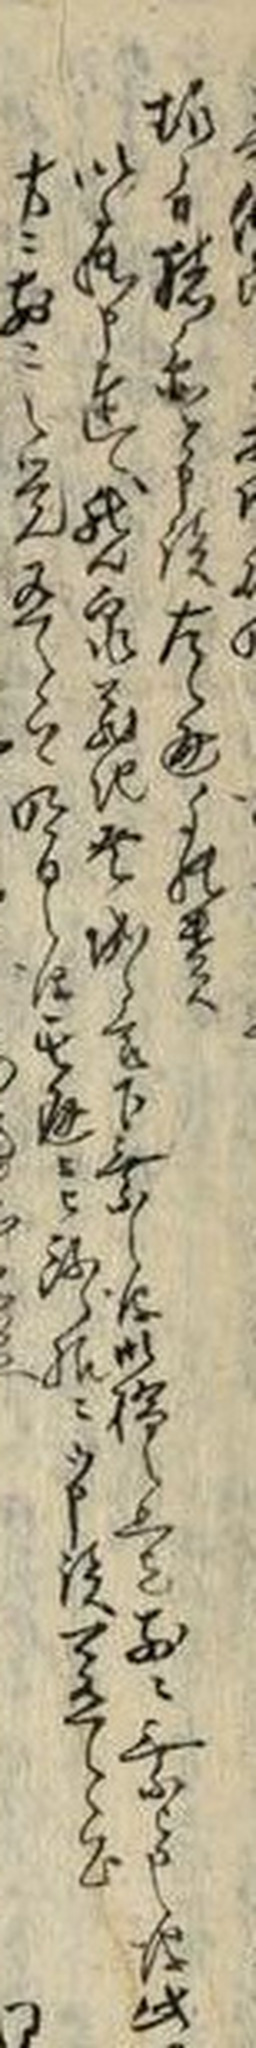方ニ前々之覚有之候ハヽ明日之儀其通ニ被致候様ニ御申談可有之候以上
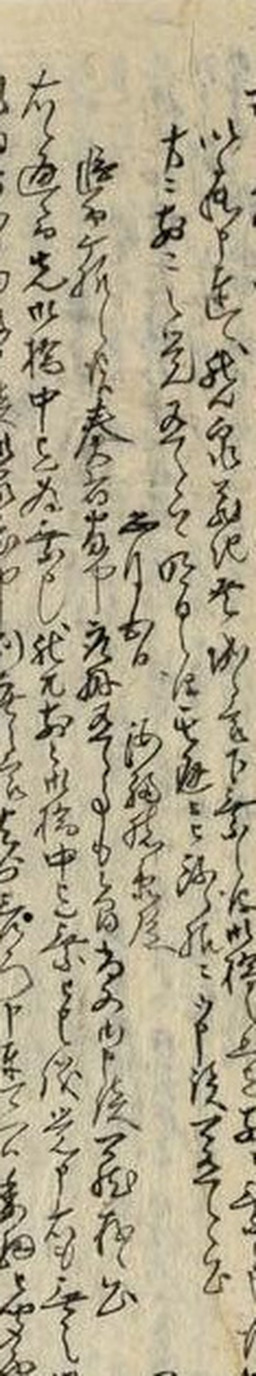追而ケ様之儀ハ奏者番中取扱有之候事も候間尚又御申談可然存候以上
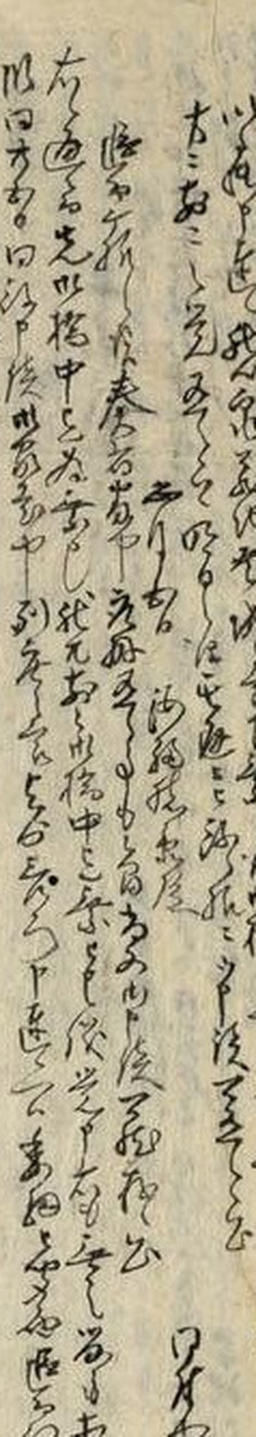追而ケ様之儀ハ奏者番中取扱有之候事も候間尚又御申談可然存候以上
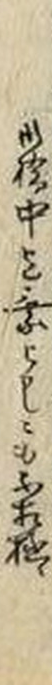御橋中迄乗被申ニも不相極候
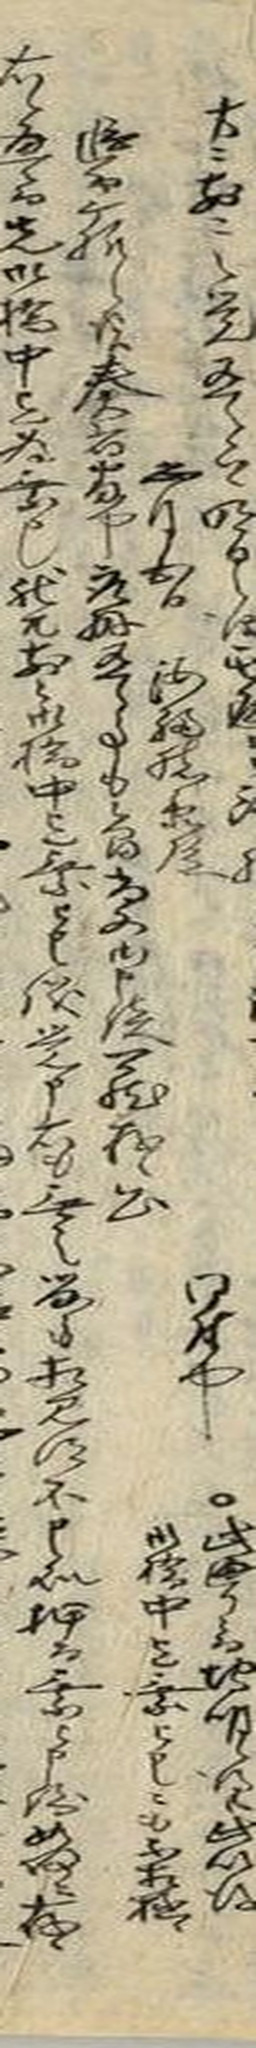右之通ニ而先御橋中迄為乗申候然共前々御橋中迄乗被申候儀覚申者も無之留ニも相見得不申候処押而乗被申儀如何ニ存候
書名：御国他国諸事之部
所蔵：福井県文書館 Fukui Prefectural Archives
